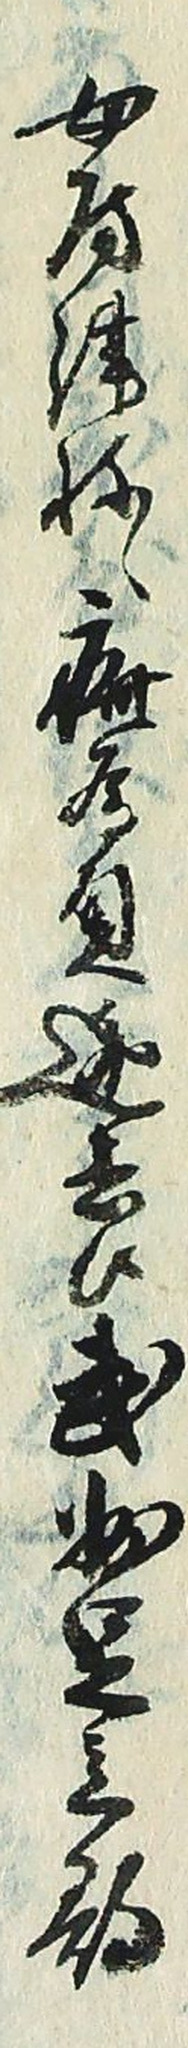女房つねへ疵為負逃去候武州足立郡
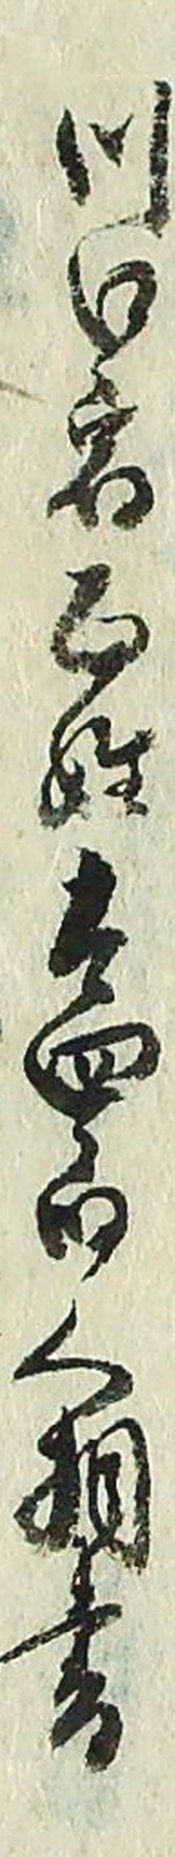川口宿百姓太四郎人相書
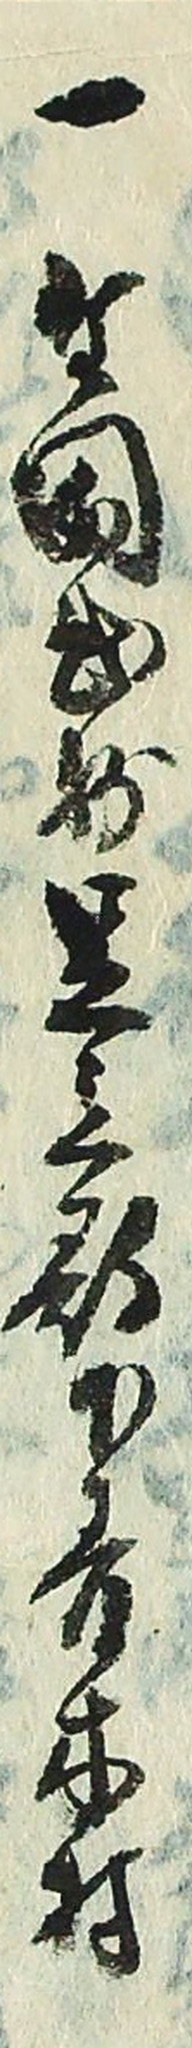一生国武州足立郡下青木村
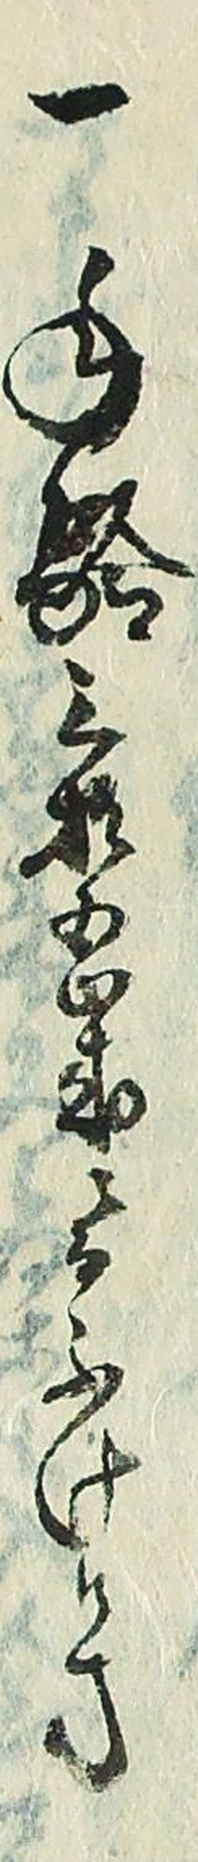一年齢三拾五歳に而ふけ候方
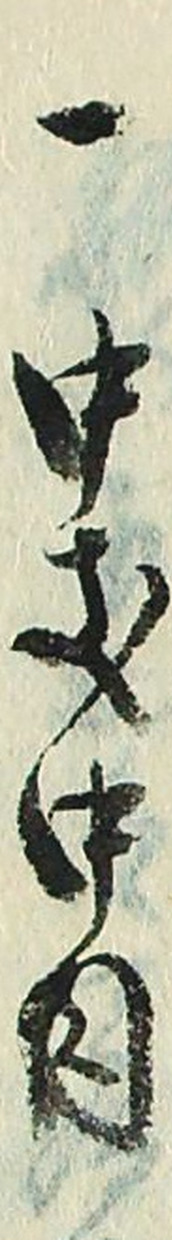一中丈中肉
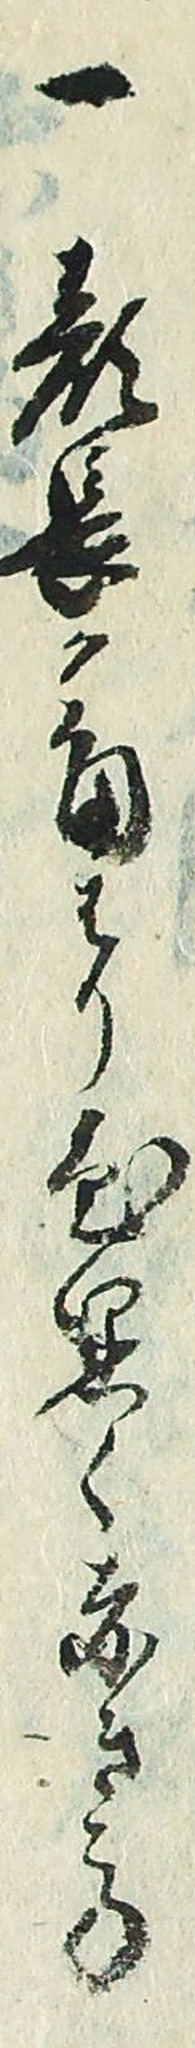一顔長く角はり色黒く赤き方
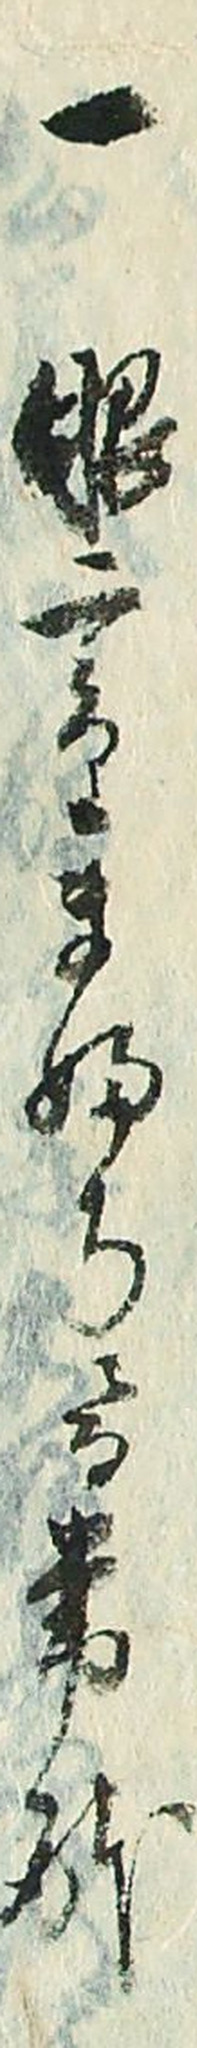一眼二重まふちに而常体

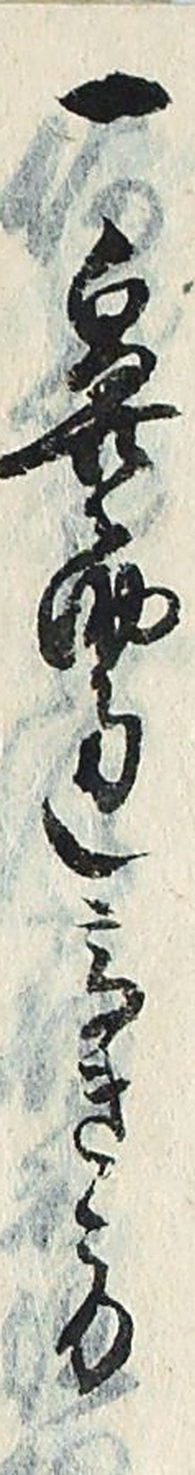一鼻筋通高き方
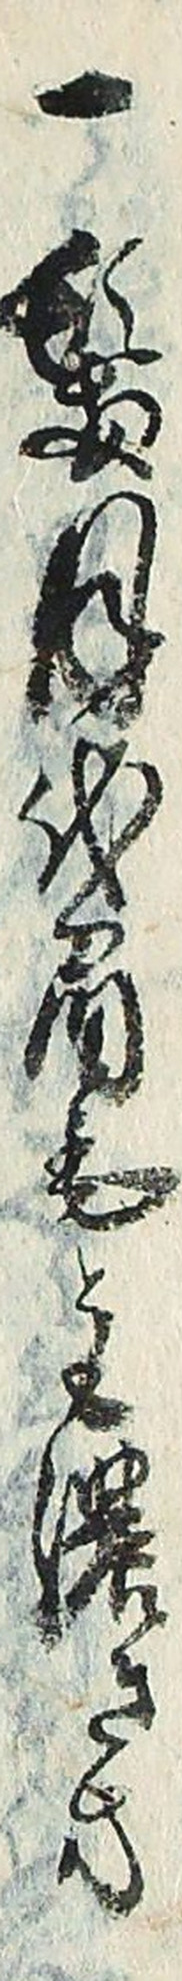一髪月代眉毛とも濃き方
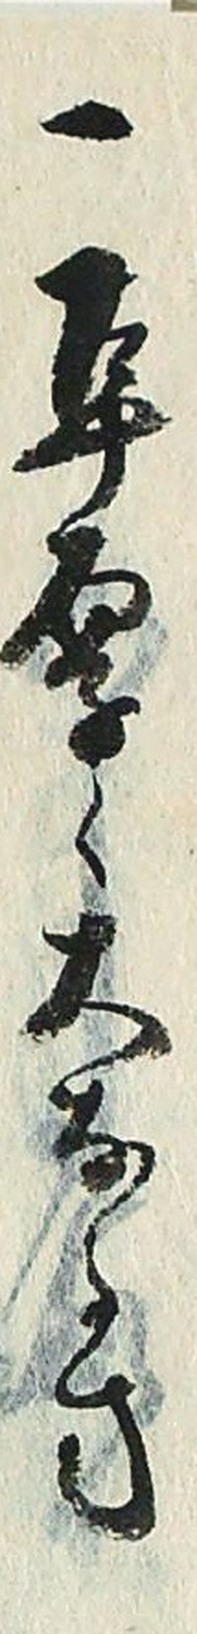一耳厚く大なる方
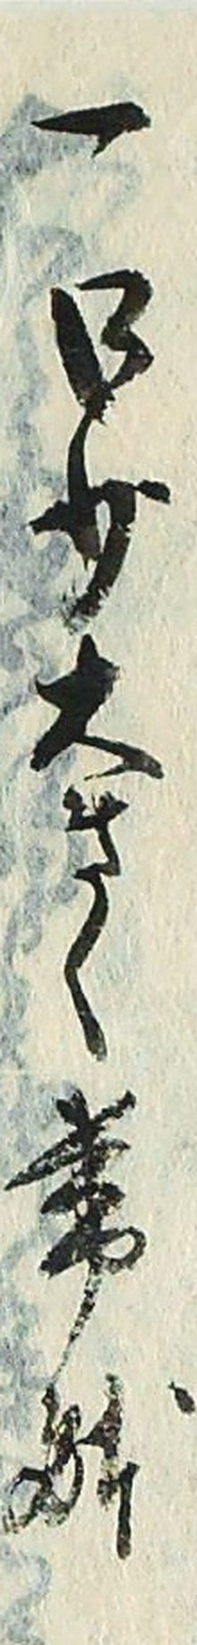一口少大きく常体
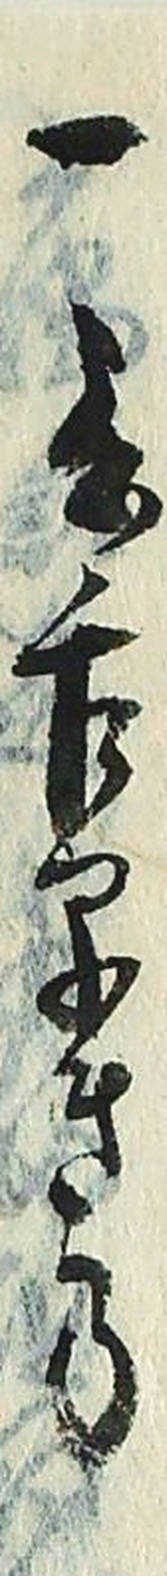一弁舌早き方
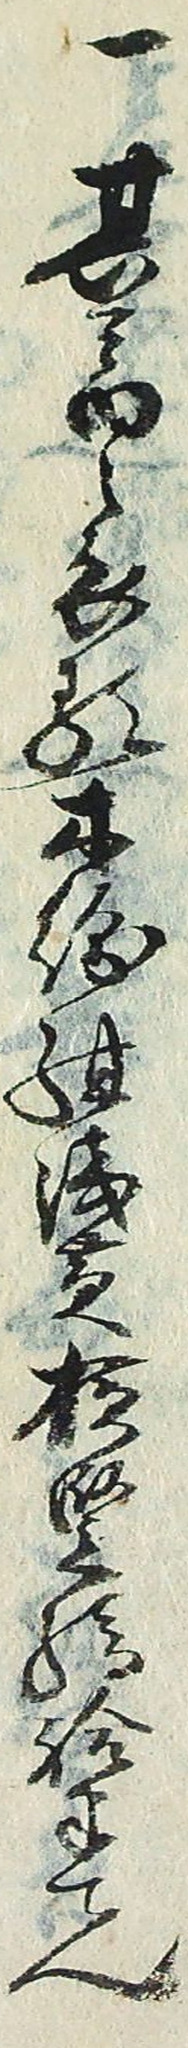一其節之衣類木綿紺浅黄横竪縞袷半てん
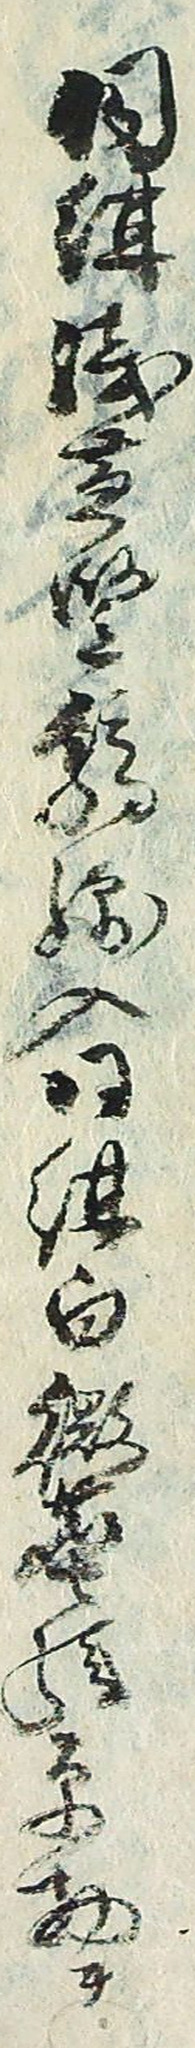同紺浅黄竪縞綿入同紺白微塵縞単物を
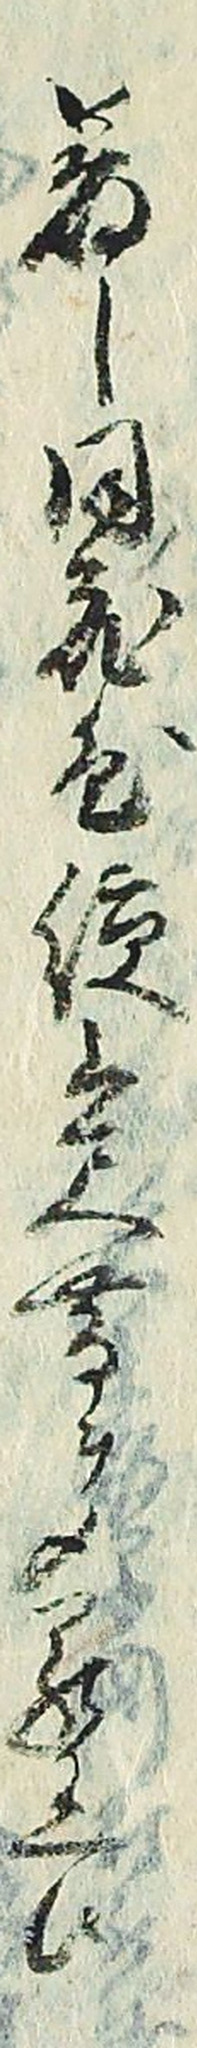着し同花色絞三尺帯を〆罷在候
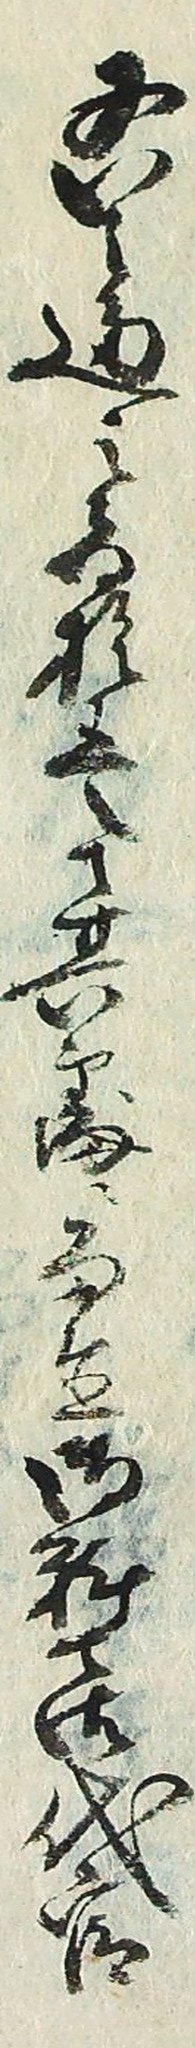右之通之者於有之は其処に留置御料は御代官
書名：諸御用御□受書控
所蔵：鳴門教育大学 Naruto University of Education
